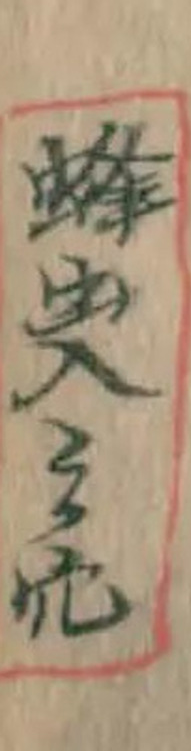蜂出入之穴
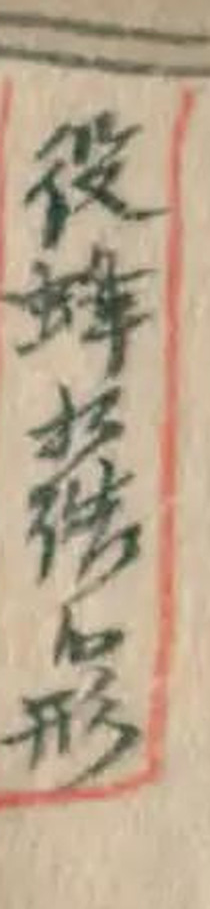役蜂相詰候形

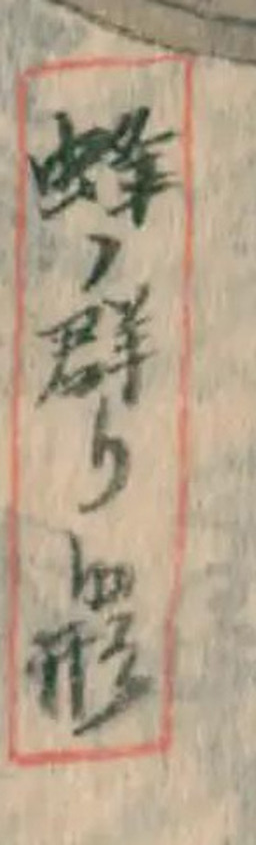蜂ノ群リ候形

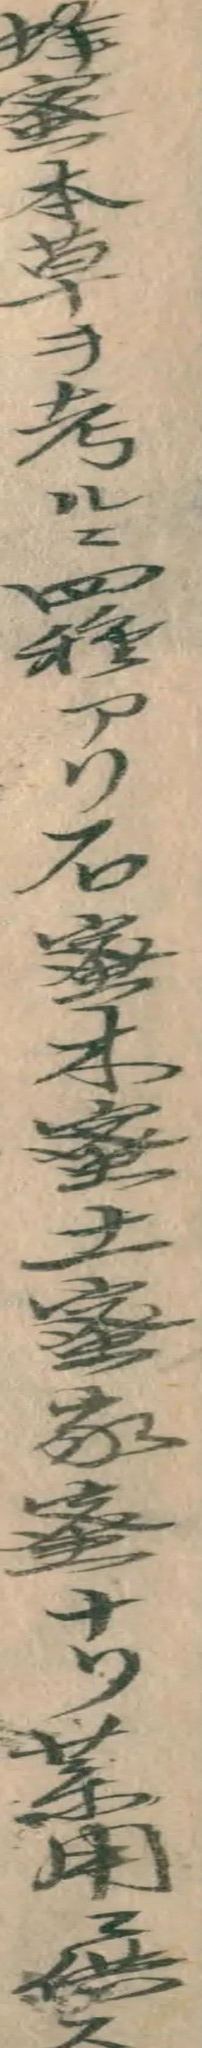蜂蜜本草ヲ考ルニ四種アリ石蜜木蜜土蜜家蜜ナリ薬用ニ供ス
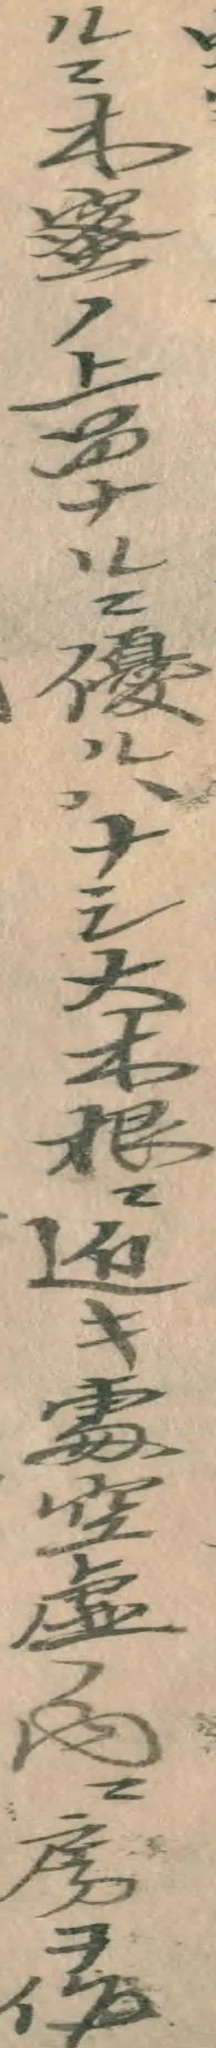ルニ木蜜ノ上品ナルニ優ルハナシ大木根ニ近キ處空虚ノ内ニ房ヲ作
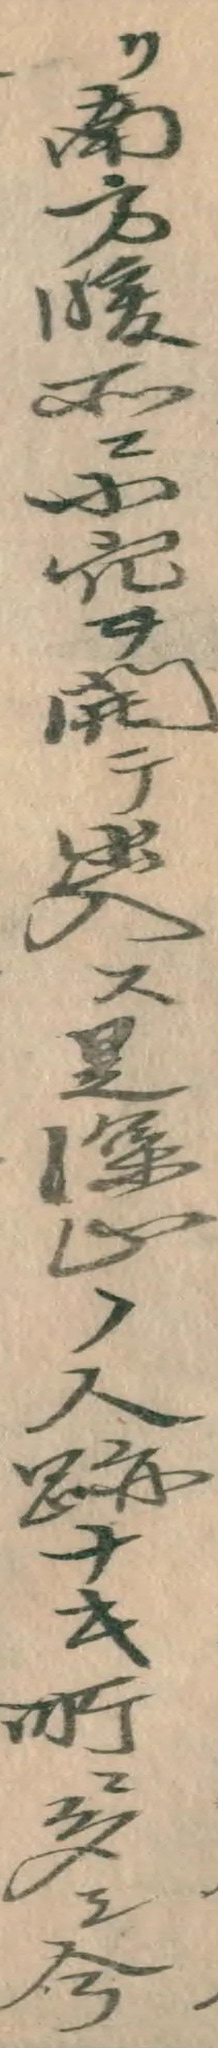リ南方暖所ニ小穴ヲ開テ出入ス是深山ノ人跡ナキ所ニ多シ今
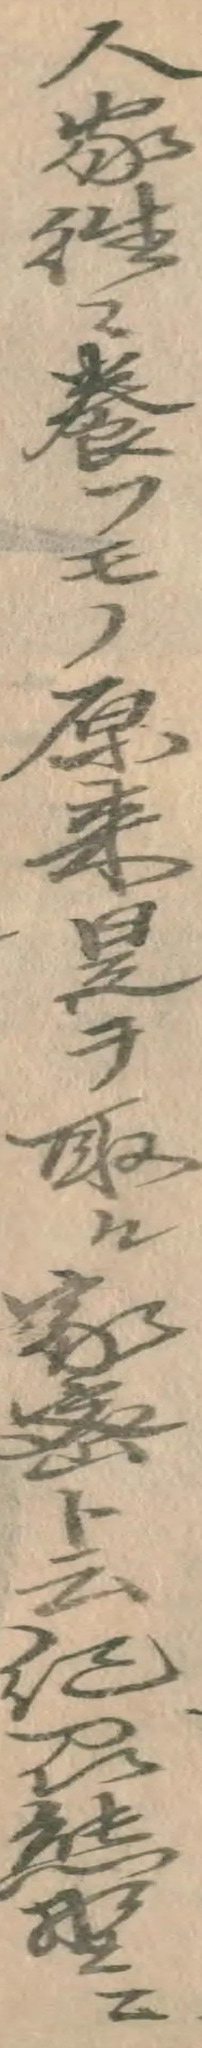人家往々養フモノ原来是ヲ取ル家密ト云紀州熊野ニ
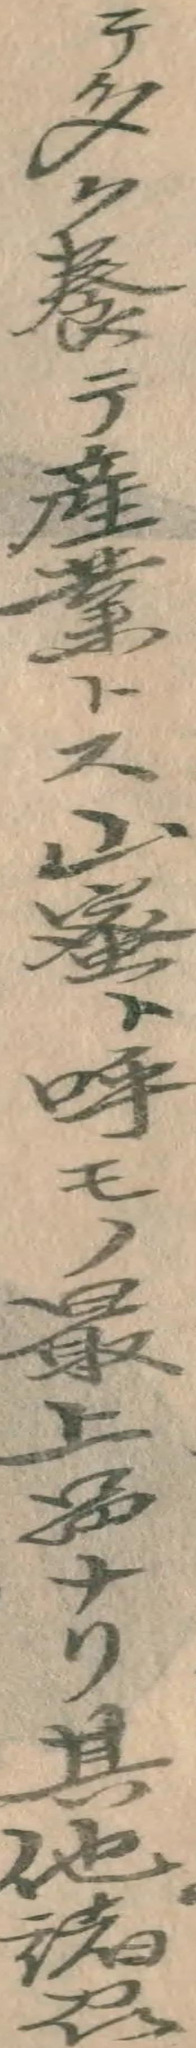テ多ク養テ産業トス山蜜ト呼モノ最上品ナリ其他諸州
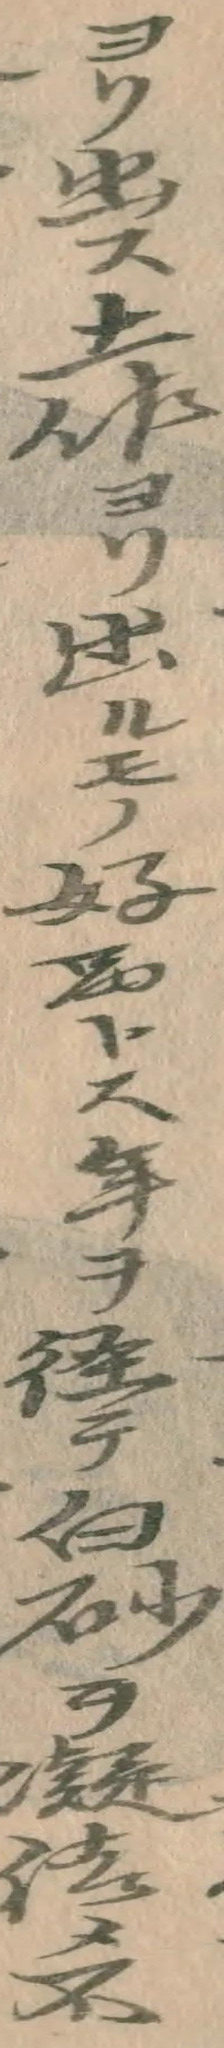ヨリ出ス土佐ヨリ出ルモノ好品トス年ヲ径＃テ白砂ヲ凝結シテ不
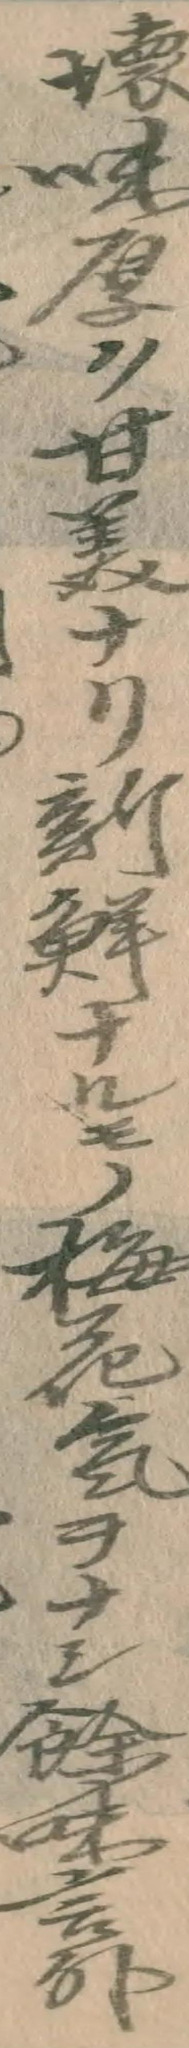壊味厚ク甘美ナリ新鮮ナルモノ梅花気ヲナシ餘味言外
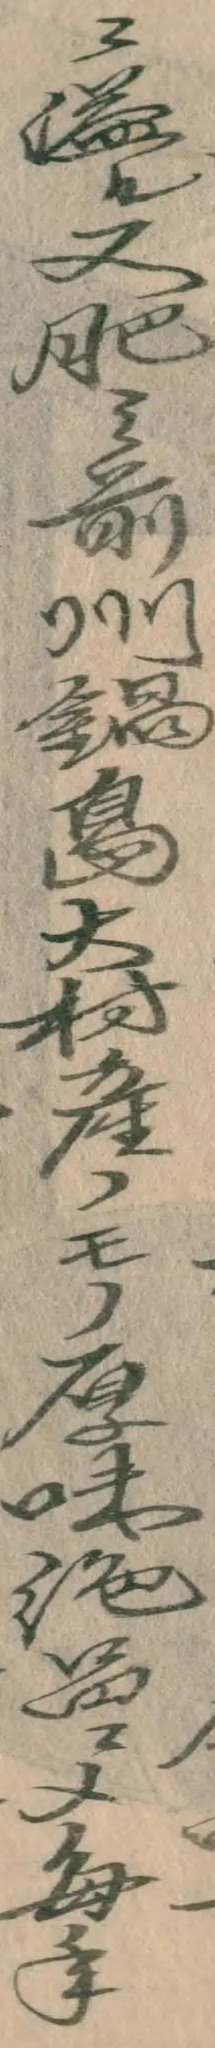ニ溢ル又肥之前州鍋島大村産ノモノ厚味絶品ニシテ毎年
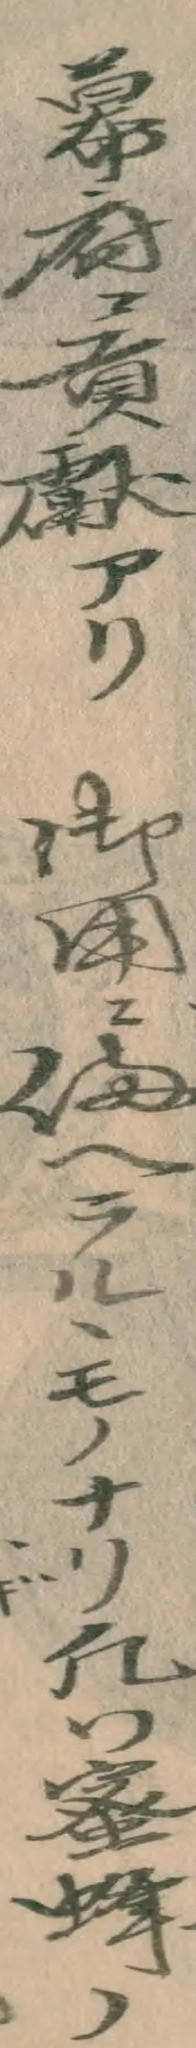幕府ニ貢献アリ御用ニ備ヘラルヽモノナリ凡ソ蜜蜂ノ
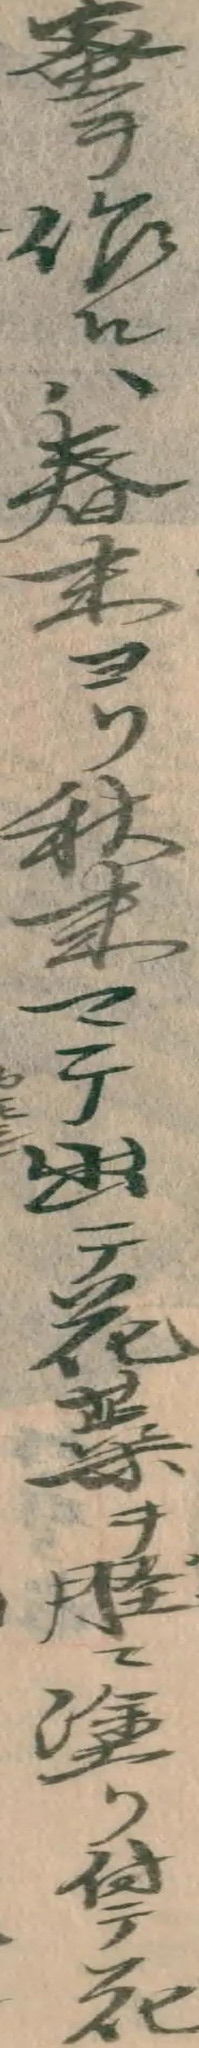蜜ヲ作ルハ春末ヨリ秋末マテ出テ花蘂ヲ脛ニ塗リ付テ花
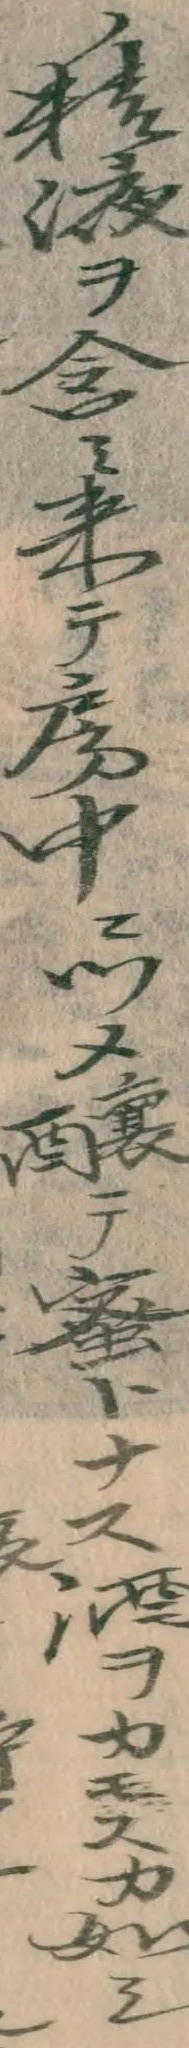ノ精液ヲ含ミ来テ房中ニツメ醸テ蜜トナス酒ヲカモスカ如シ
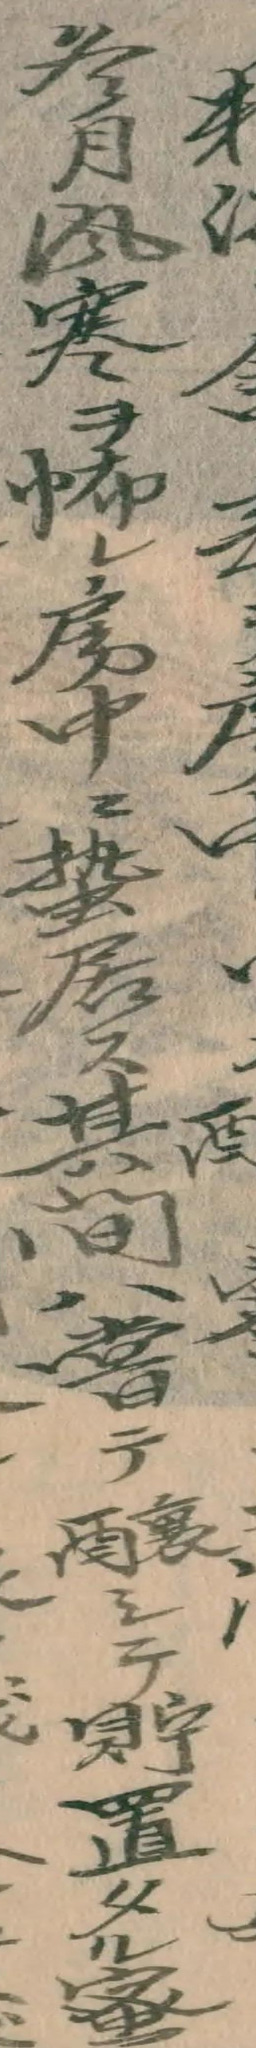冬月風寒ヲ怖レ房中ニ蟄居ス其間ハ嘗テ醸シテ貯置タル蜜
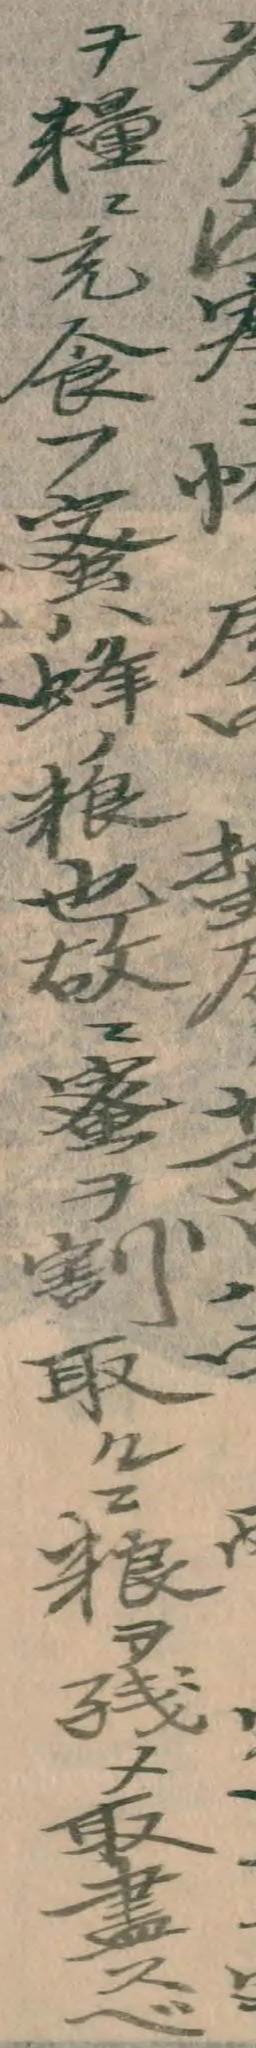ヲ糧ニ充食フ蜜ハ蜂ノ粮也故ニ蜜ヲ割取ルニ粮ヲ残シテ取盡スベ
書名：千蟲譜 3巻. [1]
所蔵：国立国会図書館 National Diet Library, JAPAN
